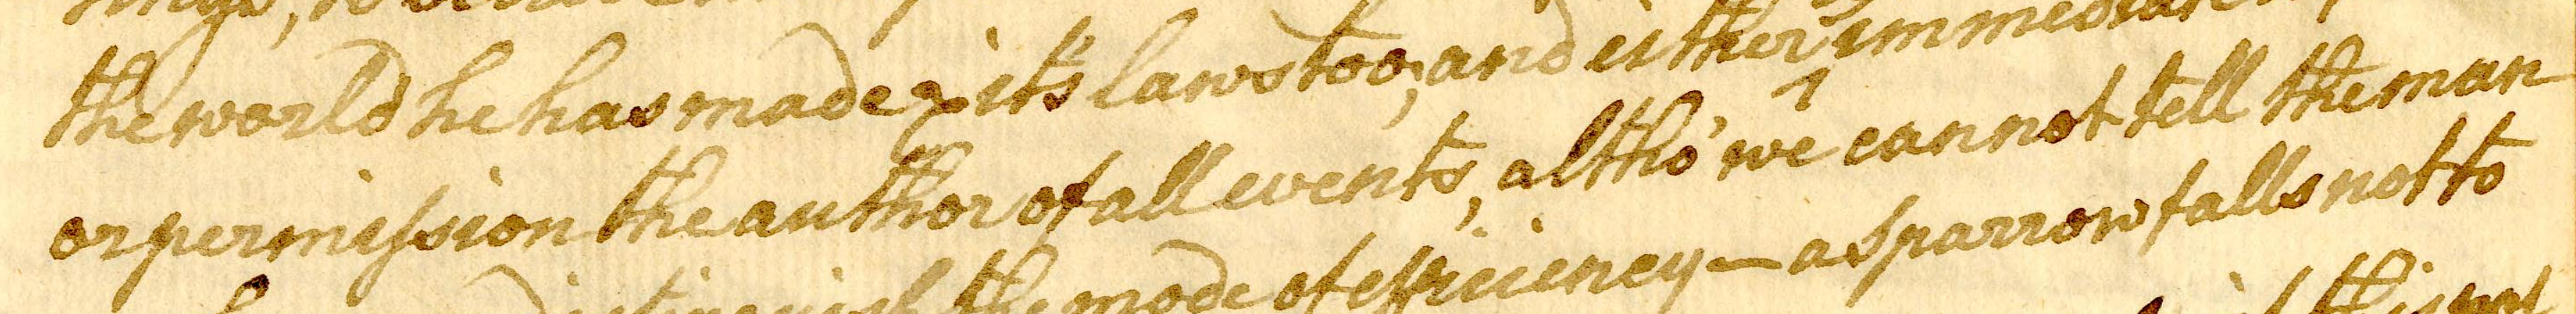or permission the author of all events, altho' we cannot tell the man
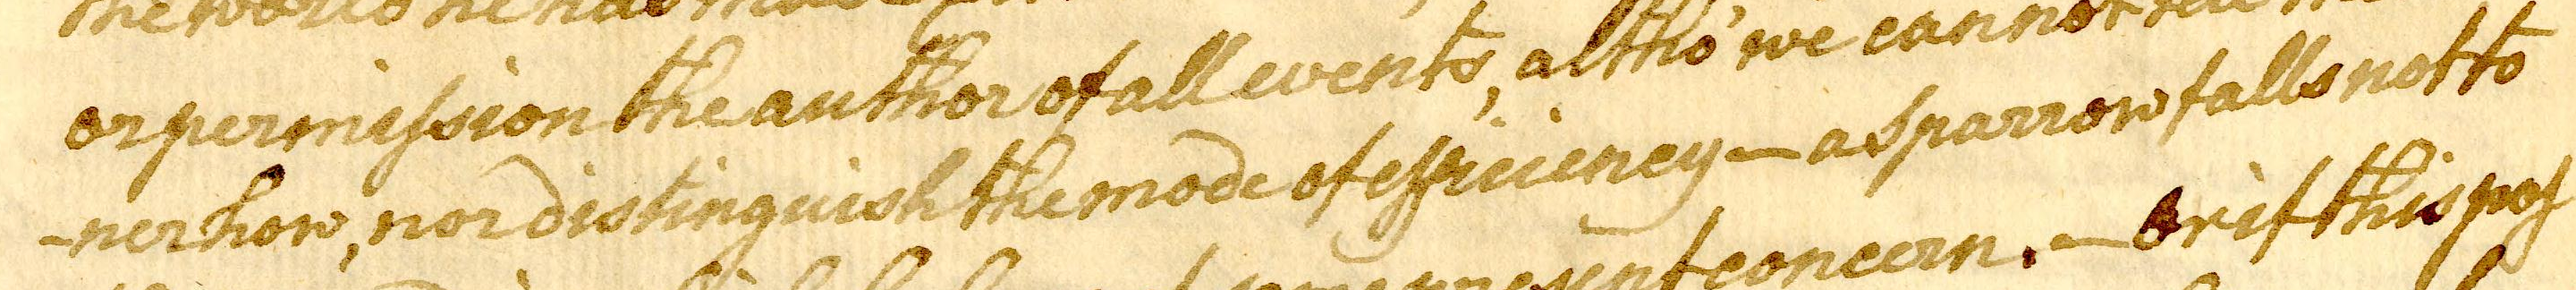-ner how, nor distinguish the mode of efficiency- a Sparrow falls not to
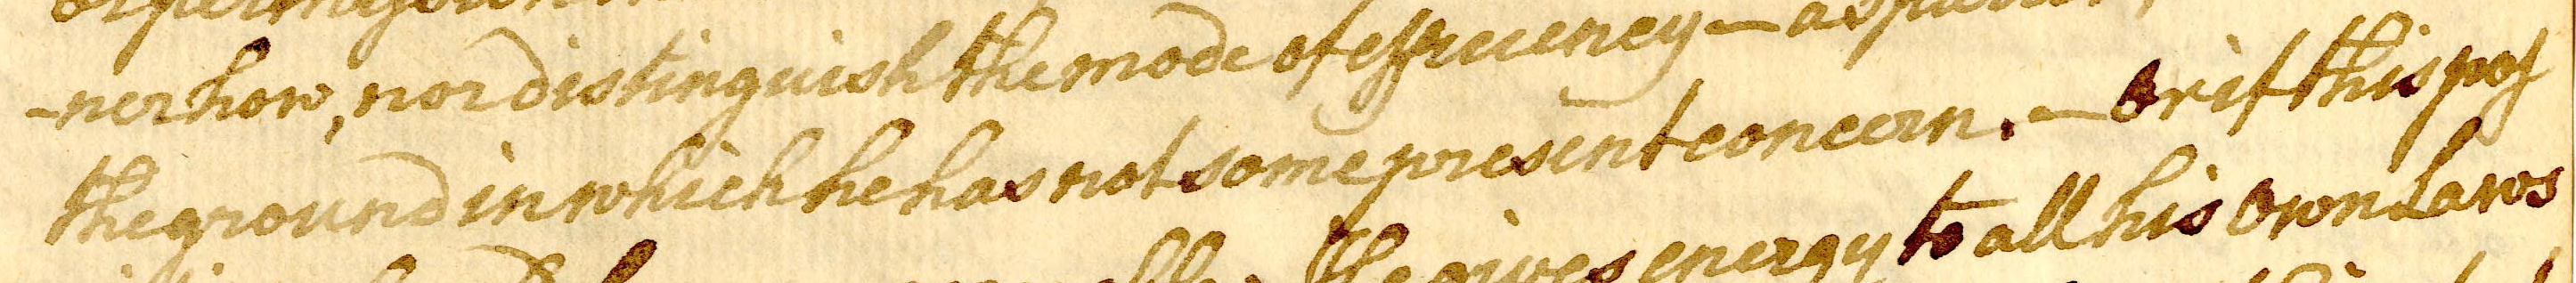the ground in which he has not some present concern.- Or if this pos
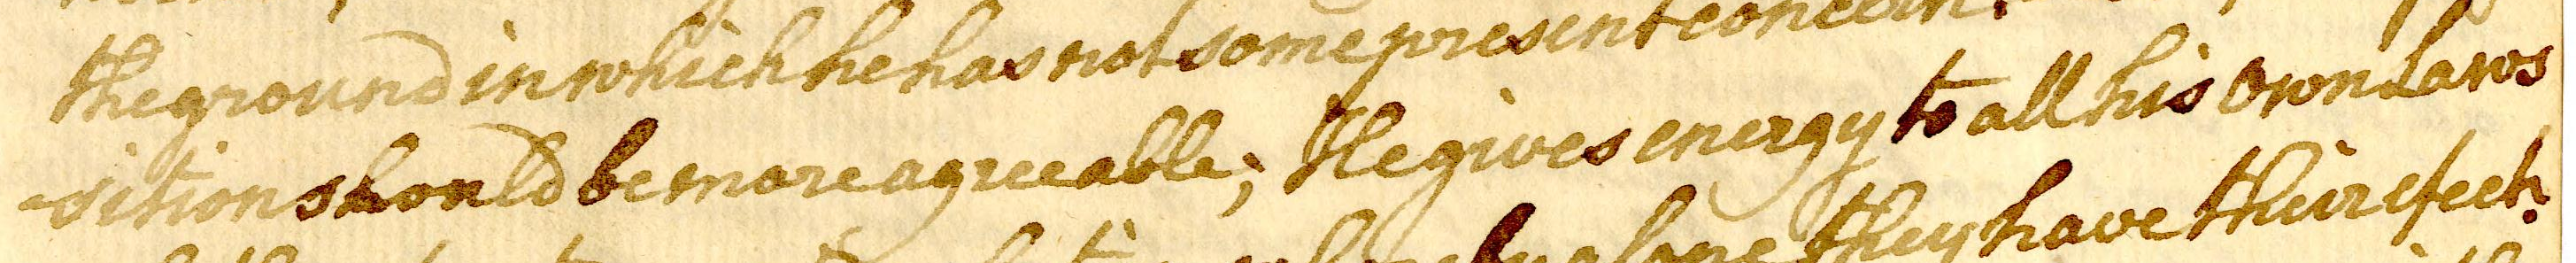-sition should be more agreeable; He gives energy to all his own Laws
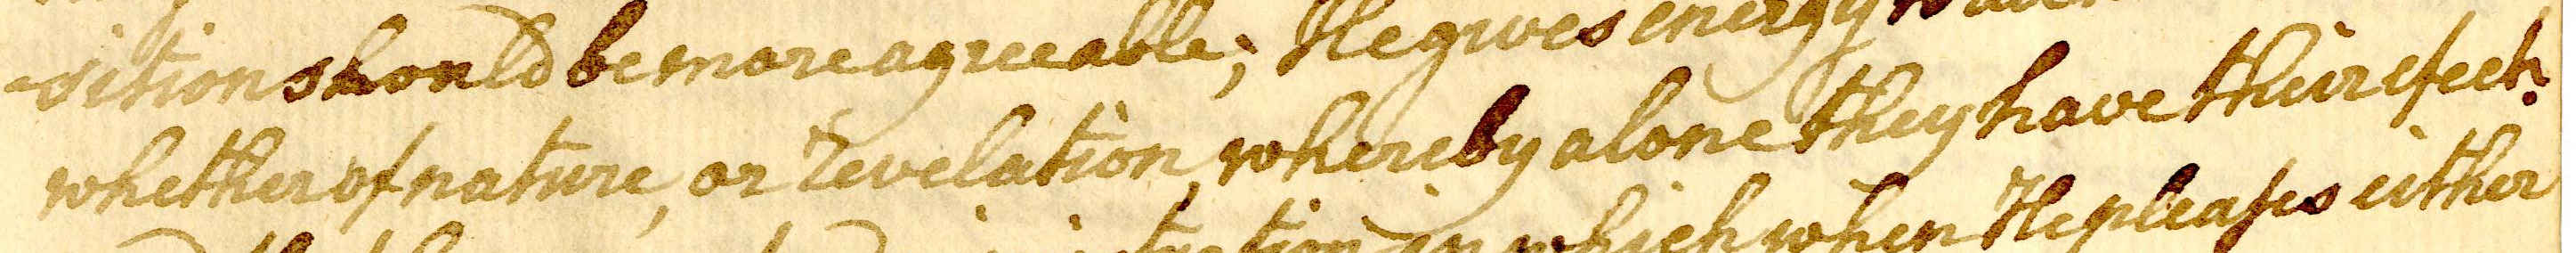whether of nature, or revelation, whereby alone they have their efect
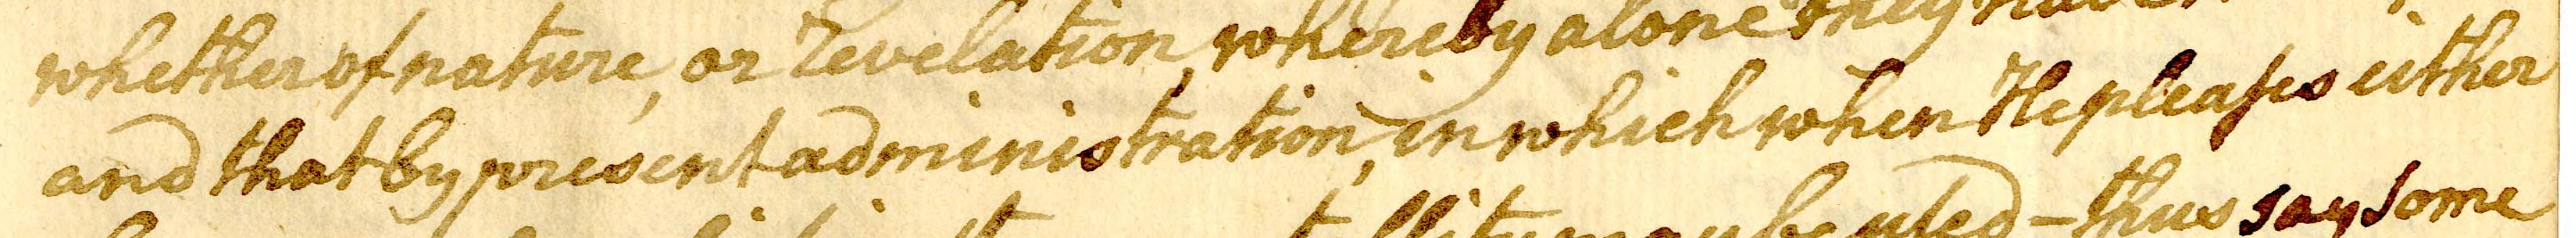and that by present administration, in which when He pleases either
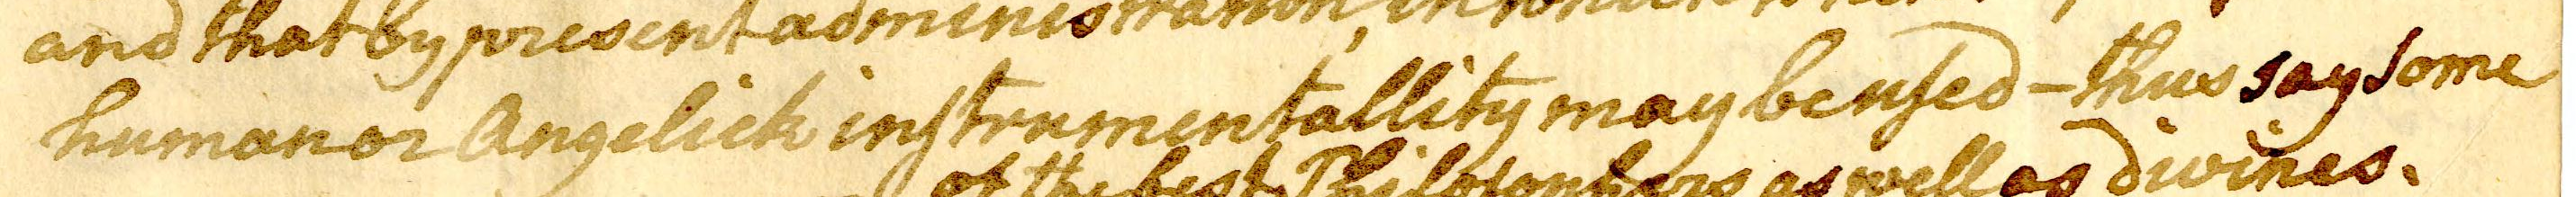human or Angelick instrumentallity may be used- thus say some
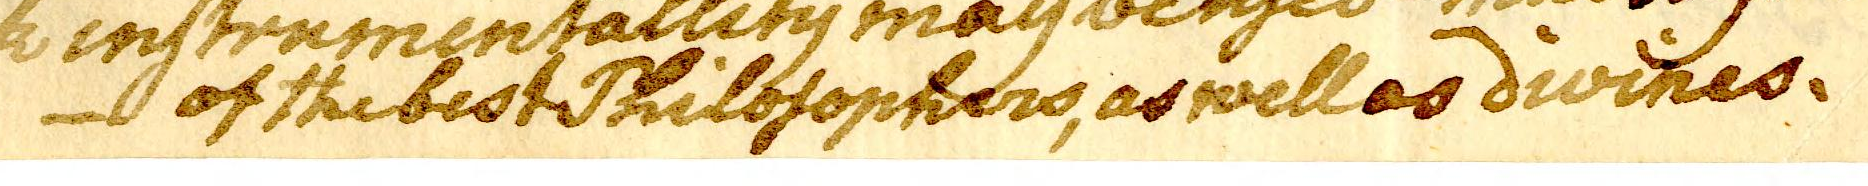-of the best Philosophers, as well as divines.
